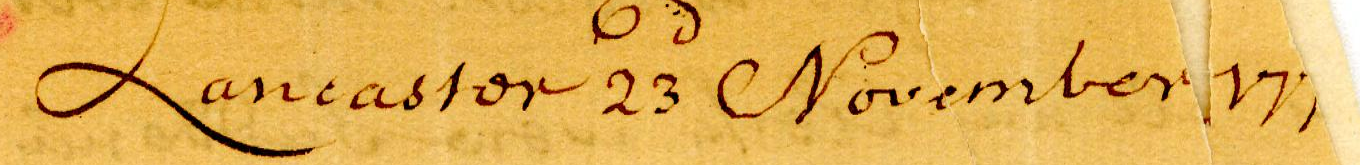Lancaster 23^d November 1777
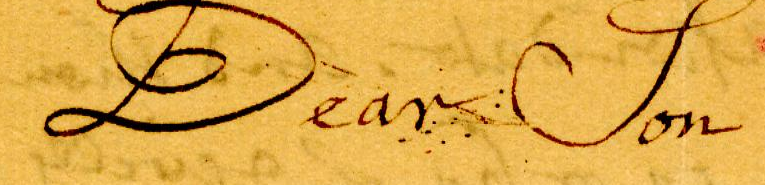Dear Son
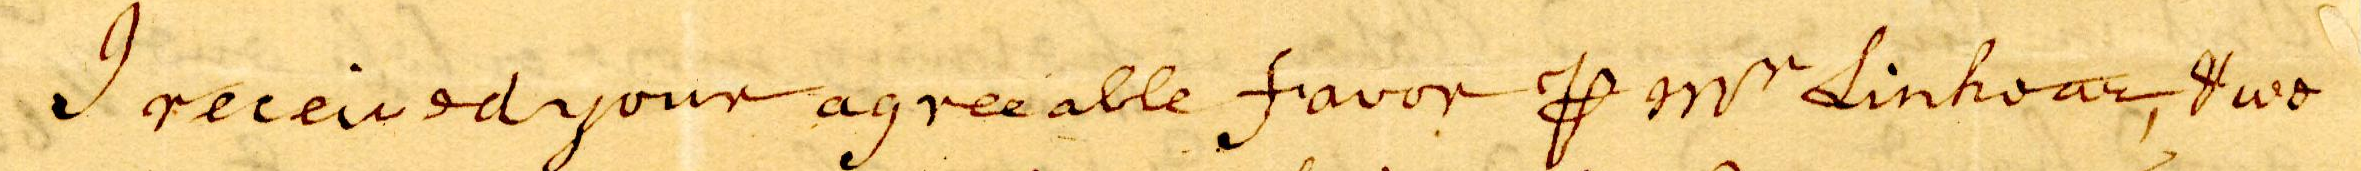I received your agreeable favor per M^r Linhear, & we
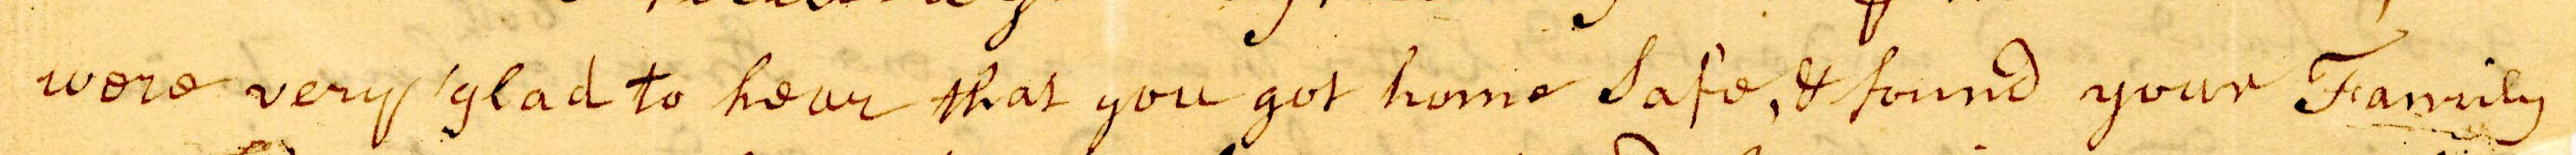were very glad to hear that you got home Safe, & found your Family
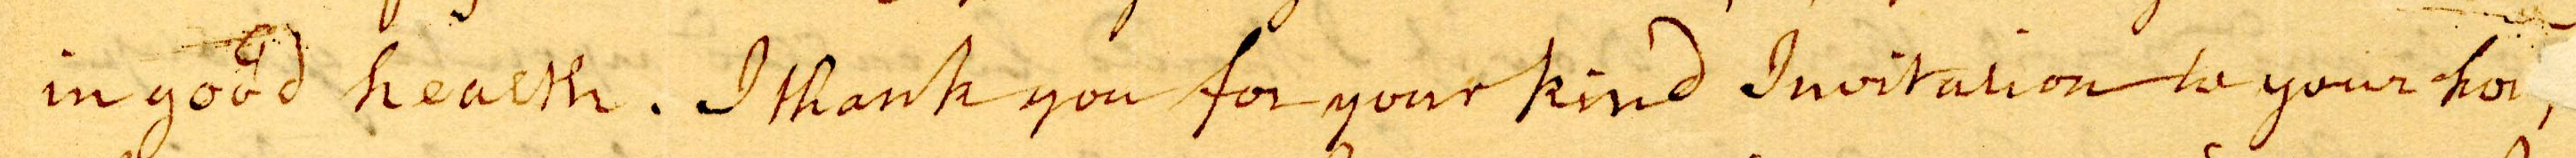in good health. I thank you for your kind Invitation to your ho[__]
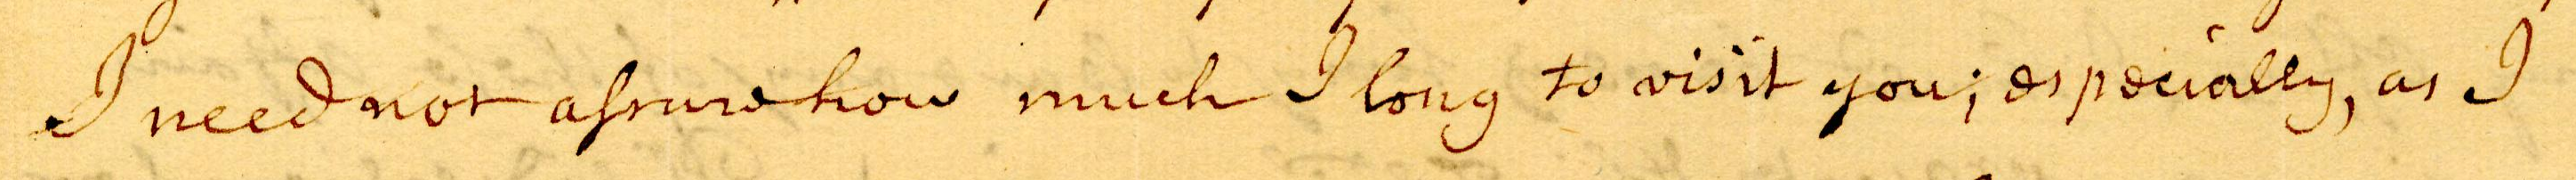I need not assure how much I long to visit you; especially, as I
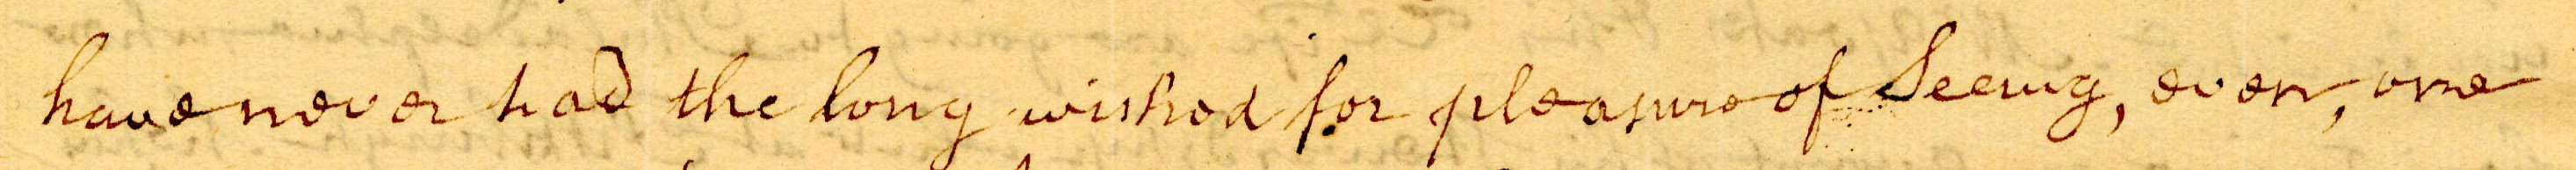have never had the long wished for pleasure of seeing, even, one
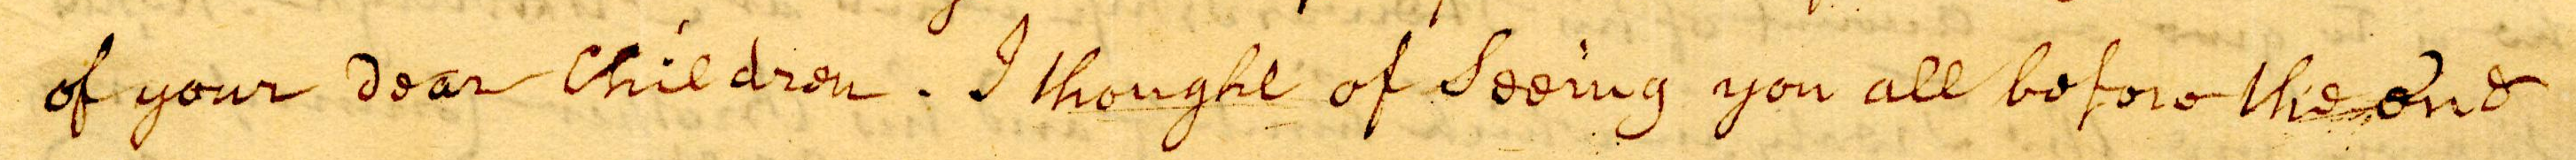of your dear Children. I thought of seeing you all before the end
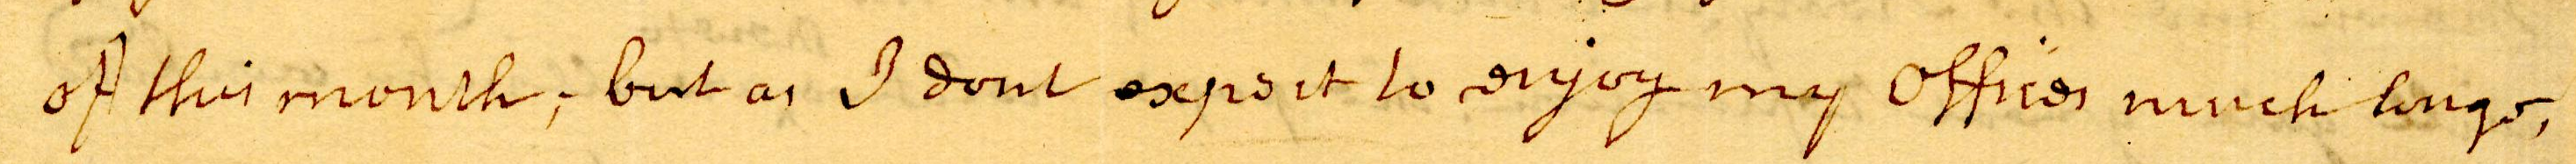of this month; but as I dont expect to enjoy my Offices much longer,
